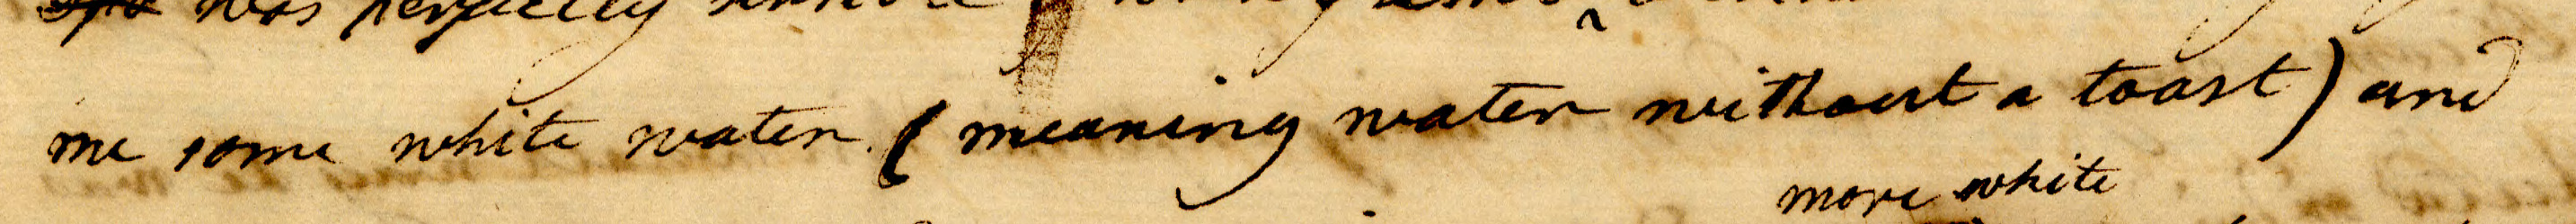me some white water (meaning water without a toast) and
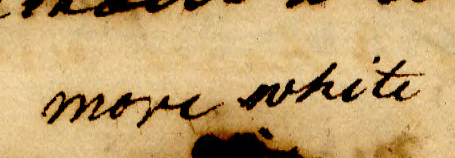more white
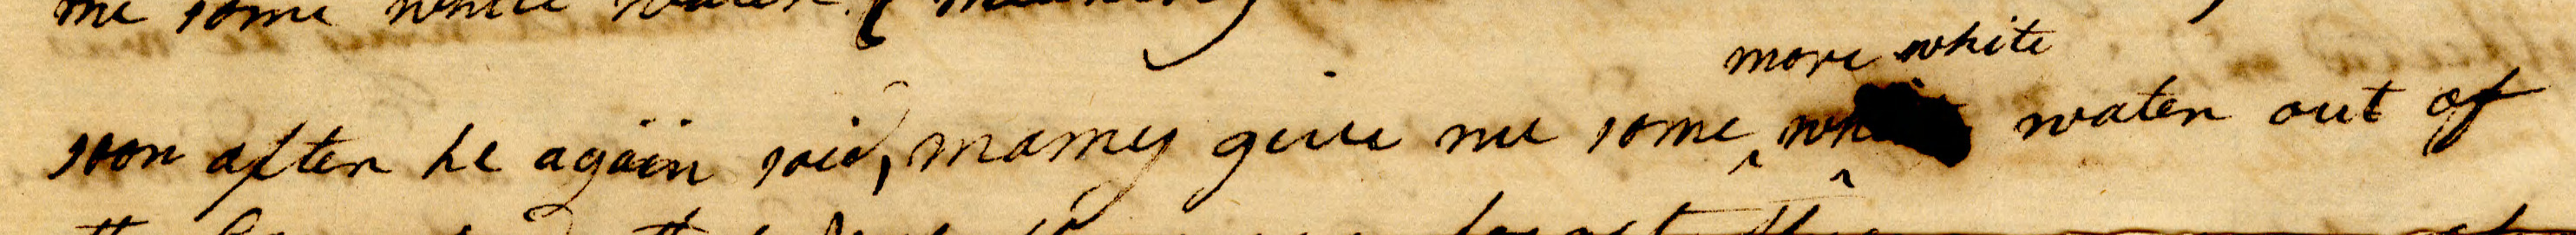soon after he again said, mamy give me some ^ ^ [wh___] water out of
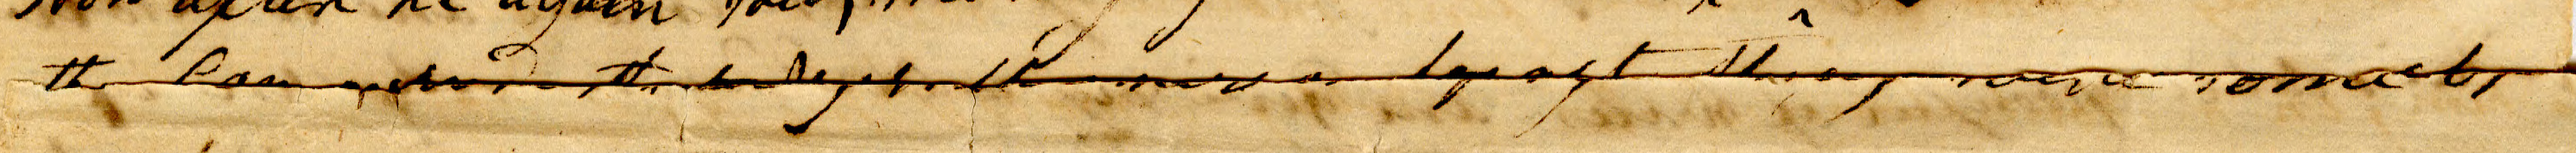[_________________________________________________]
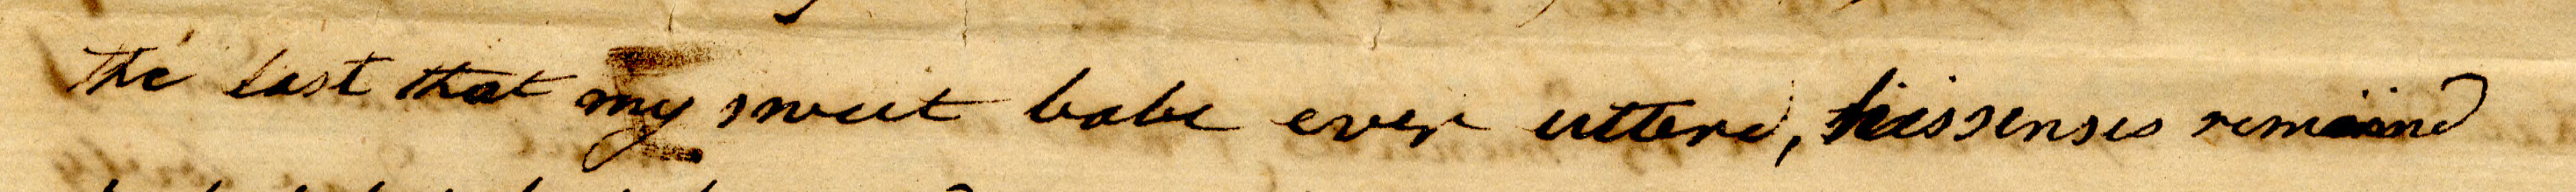the last that any sweet babe ever utterd, his senses remaind
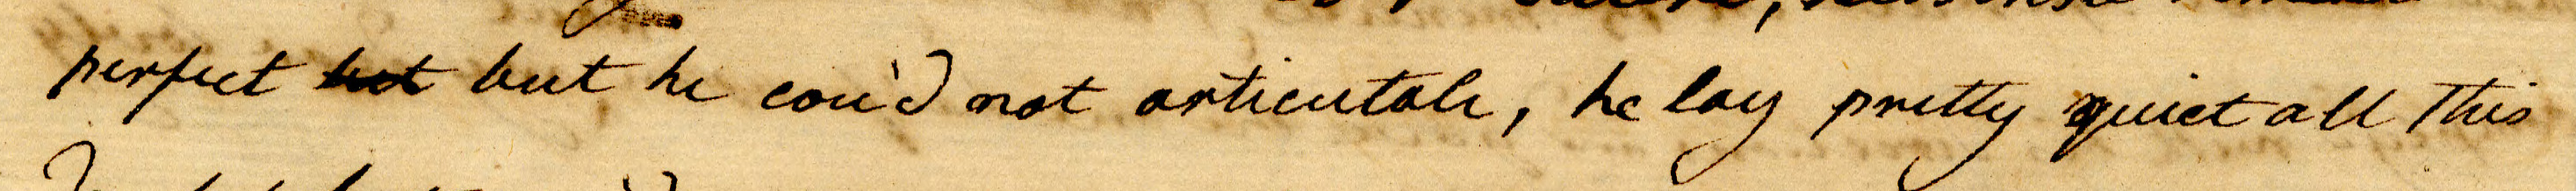perfect [but] but he cou'd not articulate, he lay pretty quiet all this
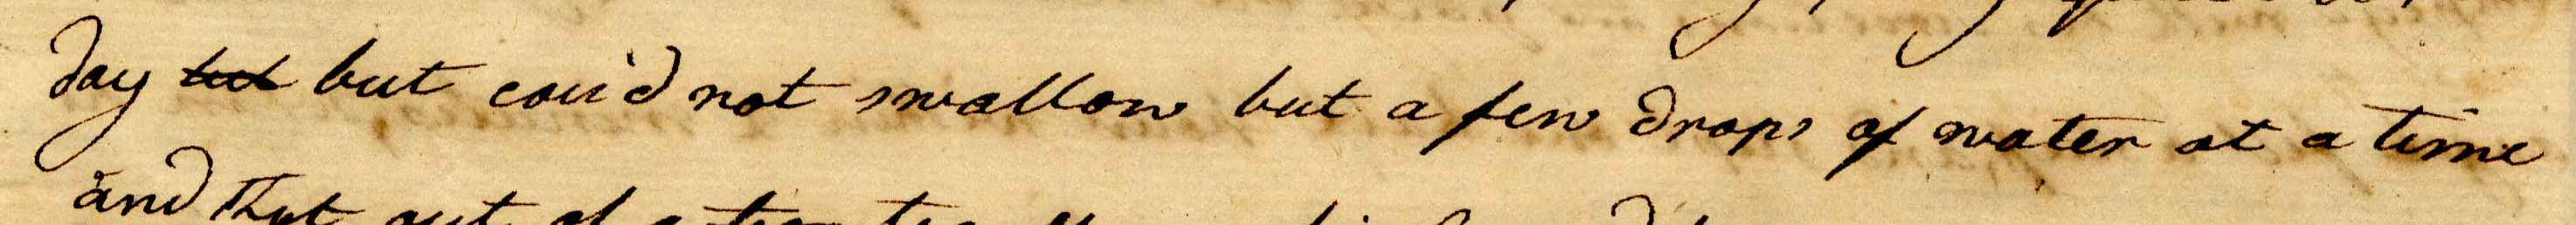day [but] but cou'd not swallow but a few drops of water at a time
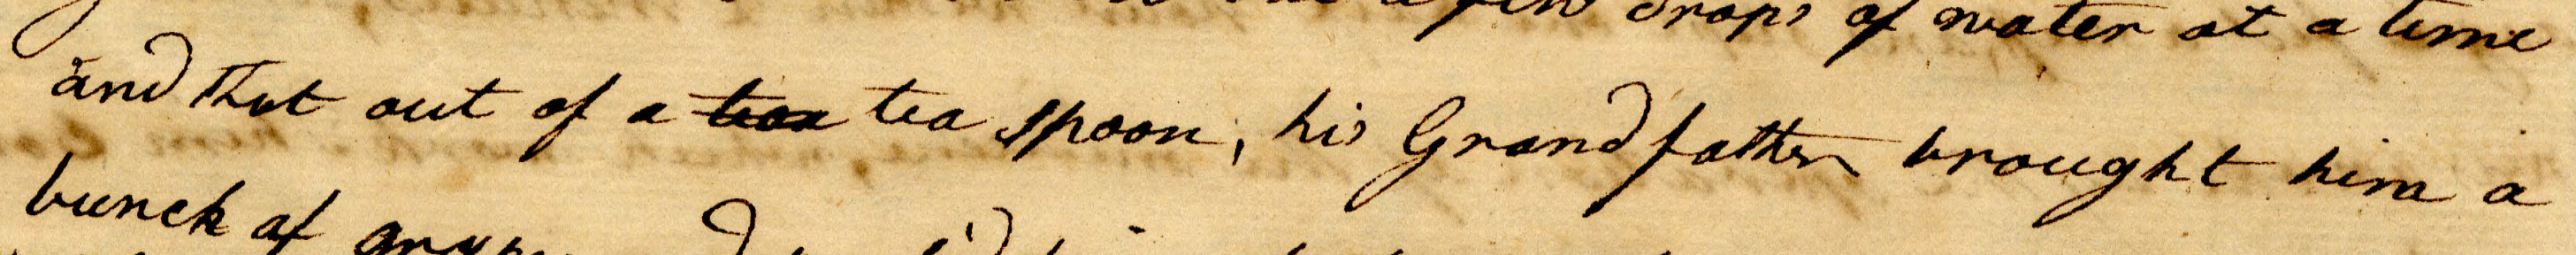and that out of a [teas] tea spoon, his Grandfather brought him a
